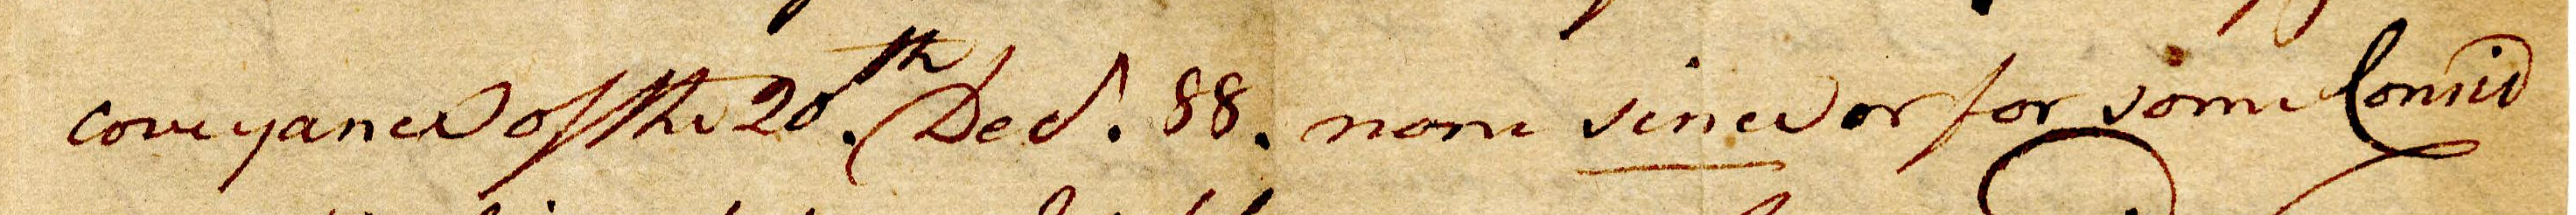conveyance of the 20^th Dec^r. 88. none since for for some Consid-
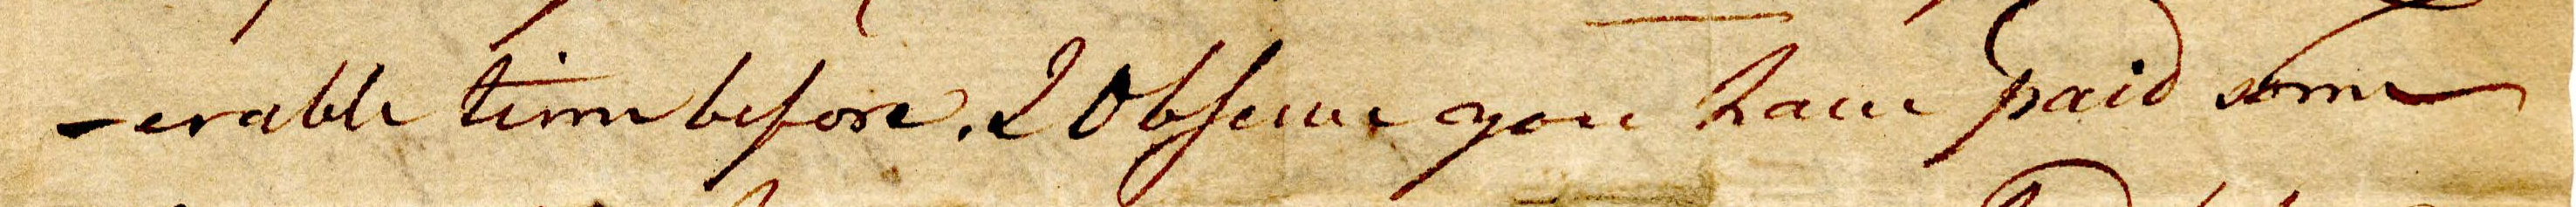-erable time before. I observe you have paid some
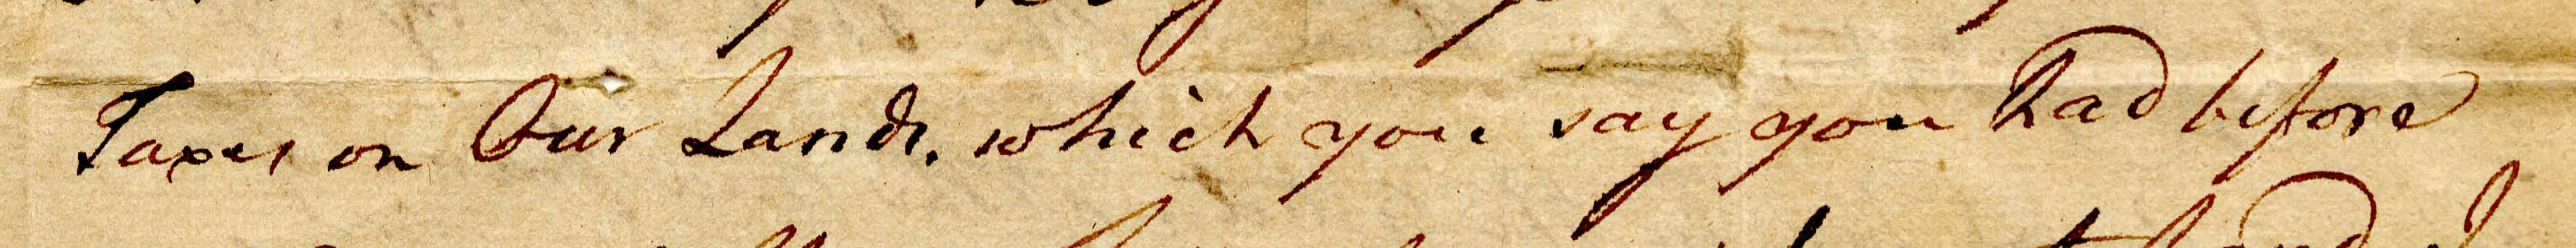Taxes on Our Lands which you say you had before
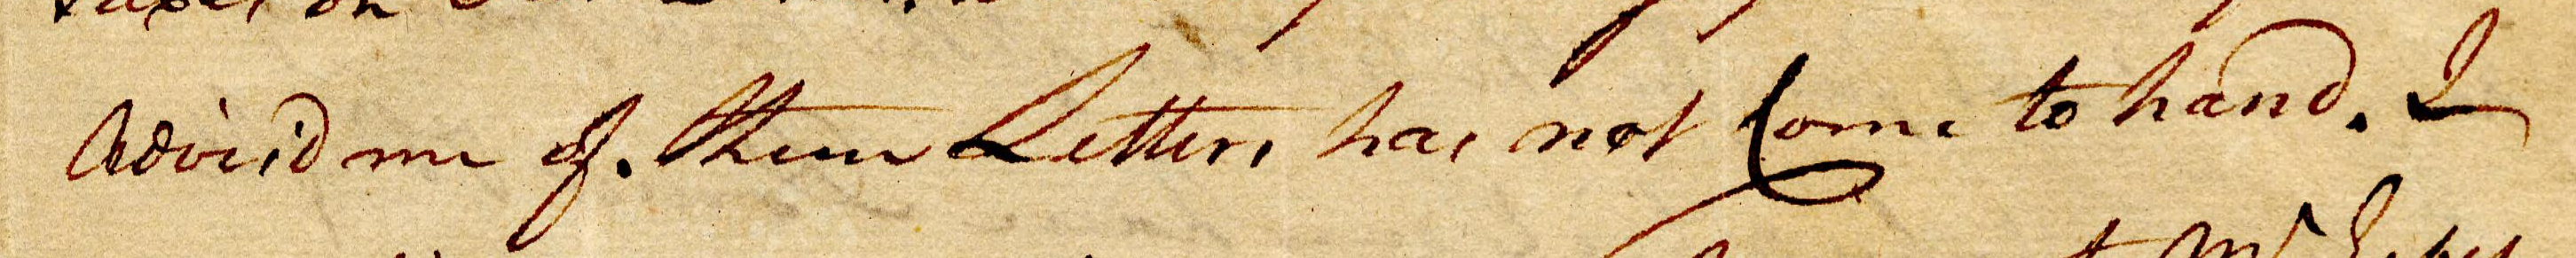Advis'd me of. these Letters has not come to hand, I
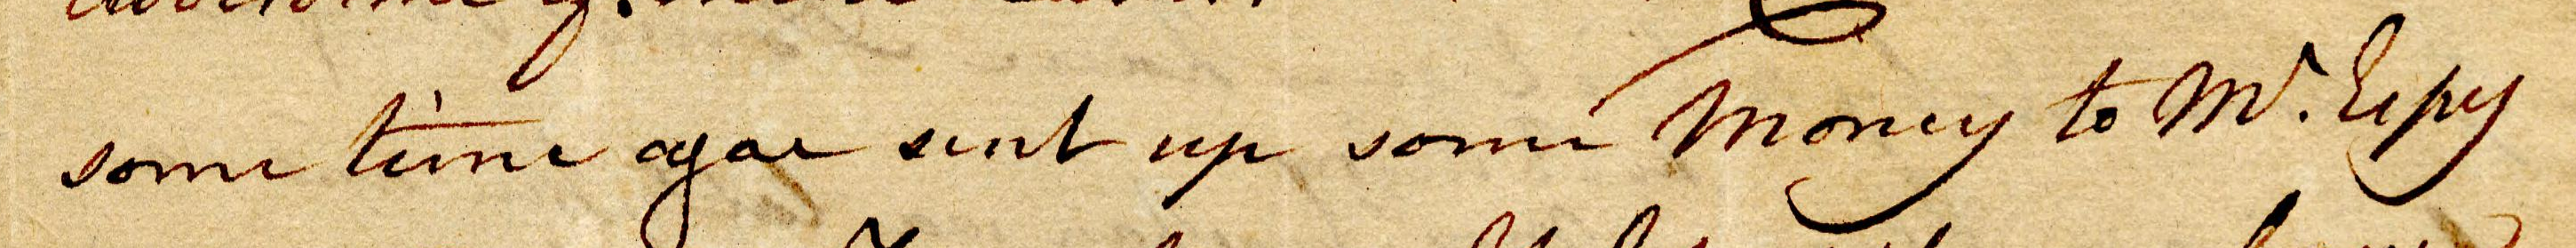some time you sent up some money to M^r. Espy
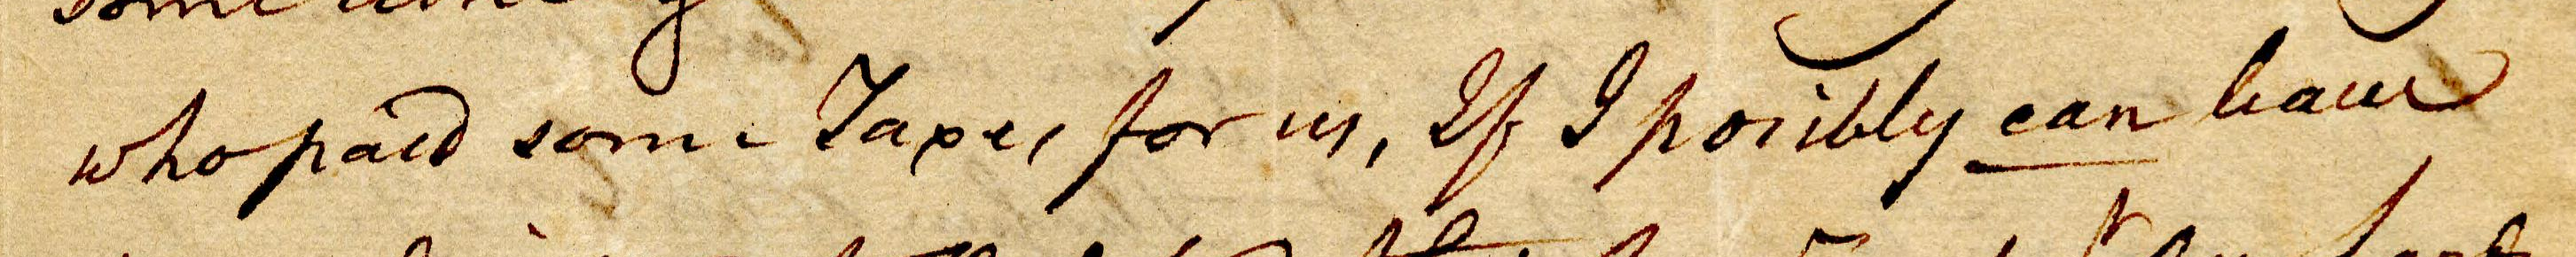who paid some Taxes for us, If I posibly can leave
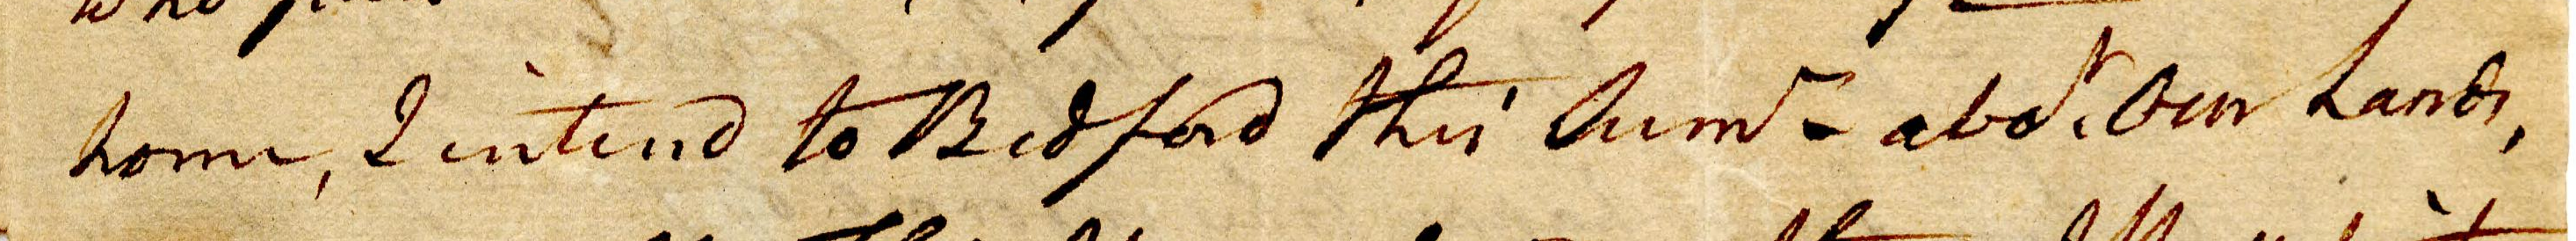home, I intend to Bedford this Sum^r. abo^t. Our Lands,
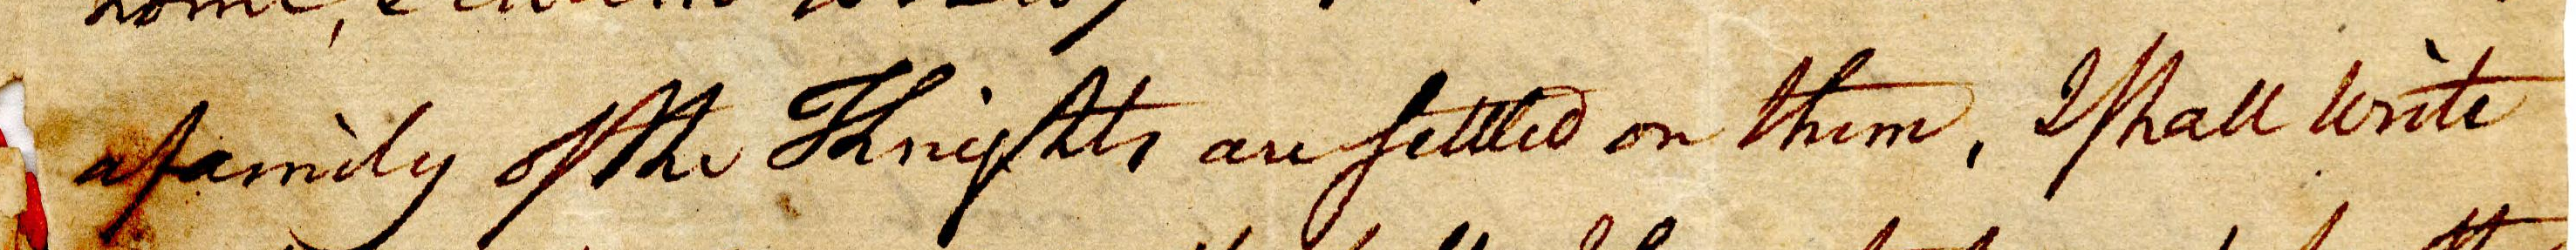a family of the Thrights are settled on them, I shall write
